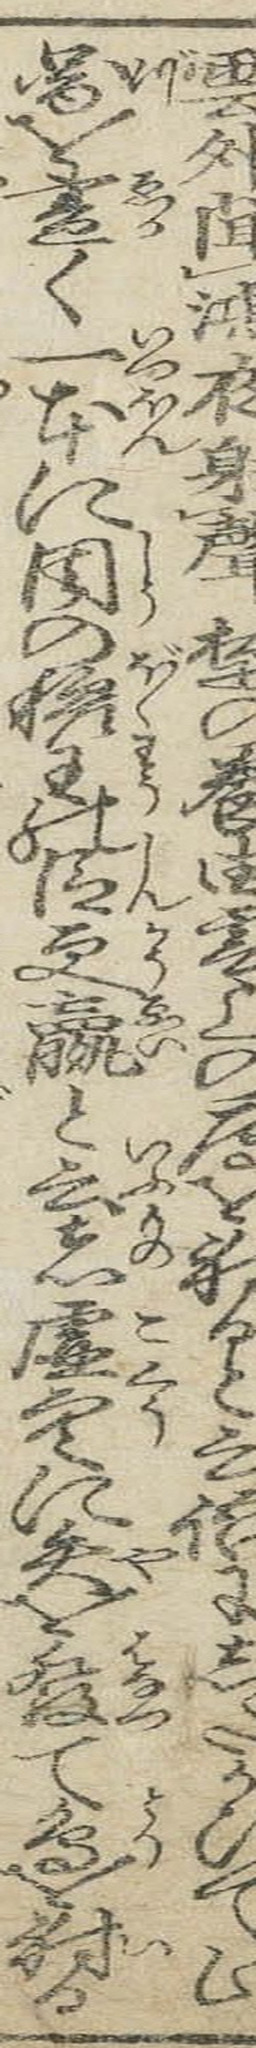図を画く一本に周の穆王の臣更嬴と云者虚空に矢を発て鳥を射る
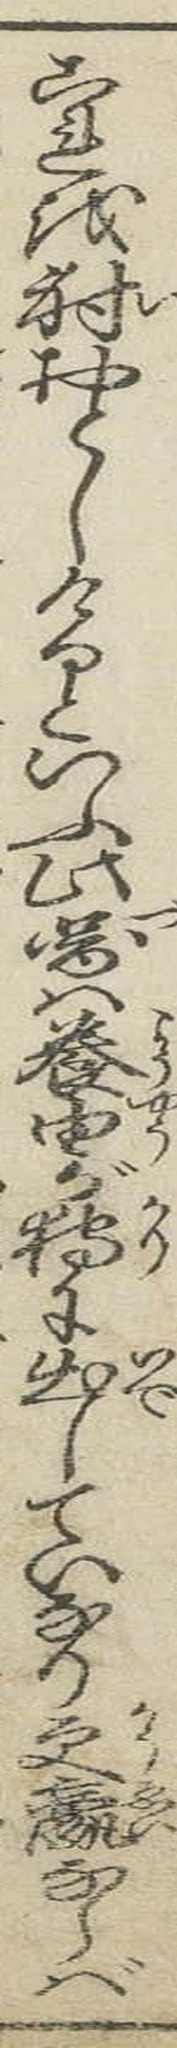これを射おとしけるといふ此図は養由が狩に出していなり更嬴ならば
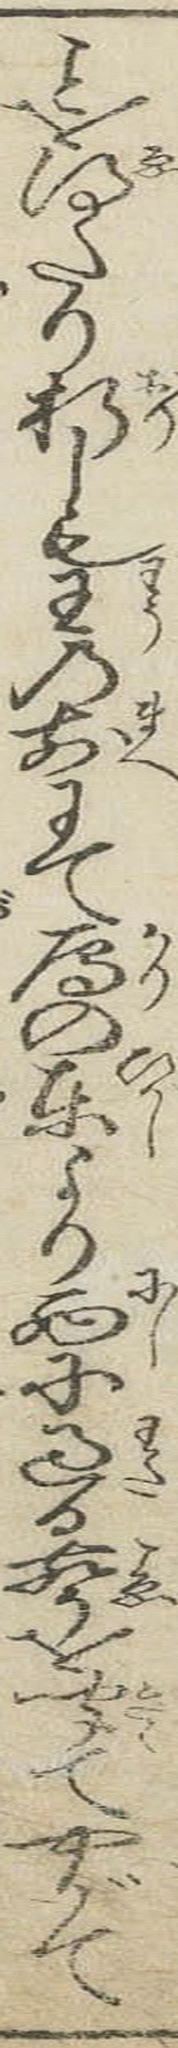ことを得たり折しも王の前にて鳫の東より西に過る声を聞てやがて
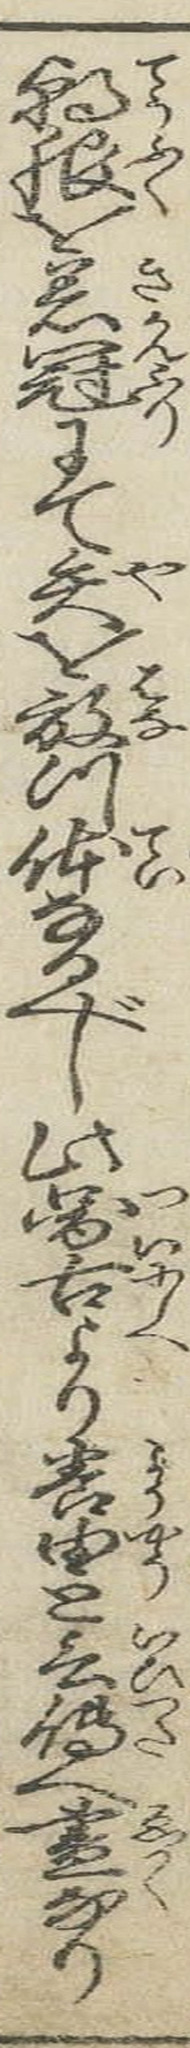朝服を着冠にて矢を放つ体なるべし此図古より養由と云伝へ画なり

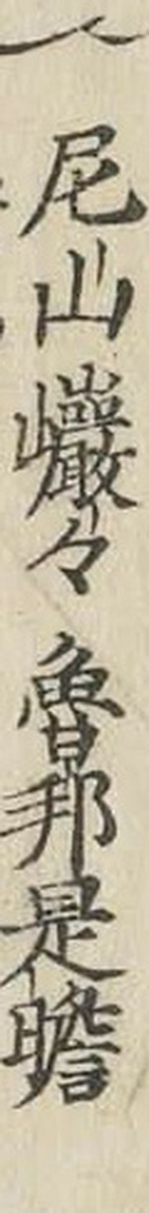尼-山巌-々魯-邦是-胆
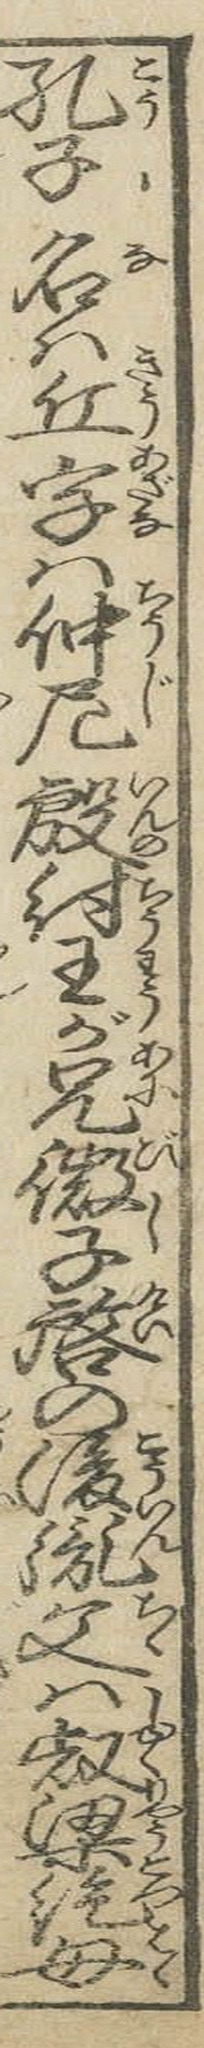孔子名は丘字は仲尼殷紂王が兄微子啓の後胤父は叔梁紇母
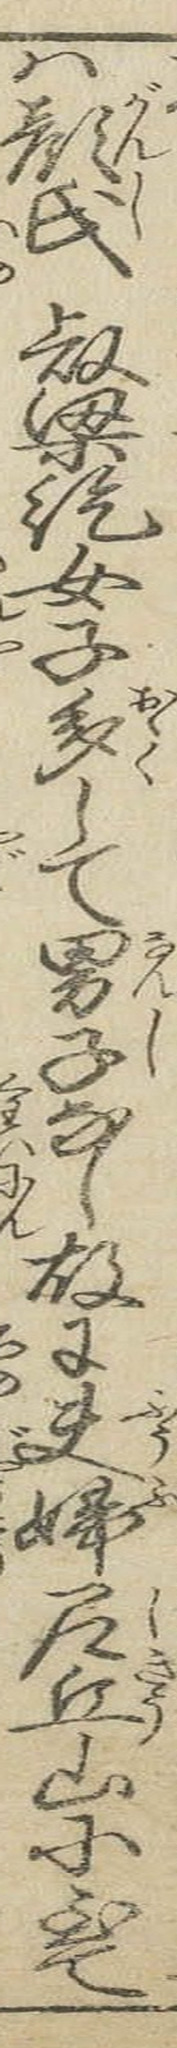は顔氏叔梁紇女子多して男子なし故に夫婦尼丘山に至て
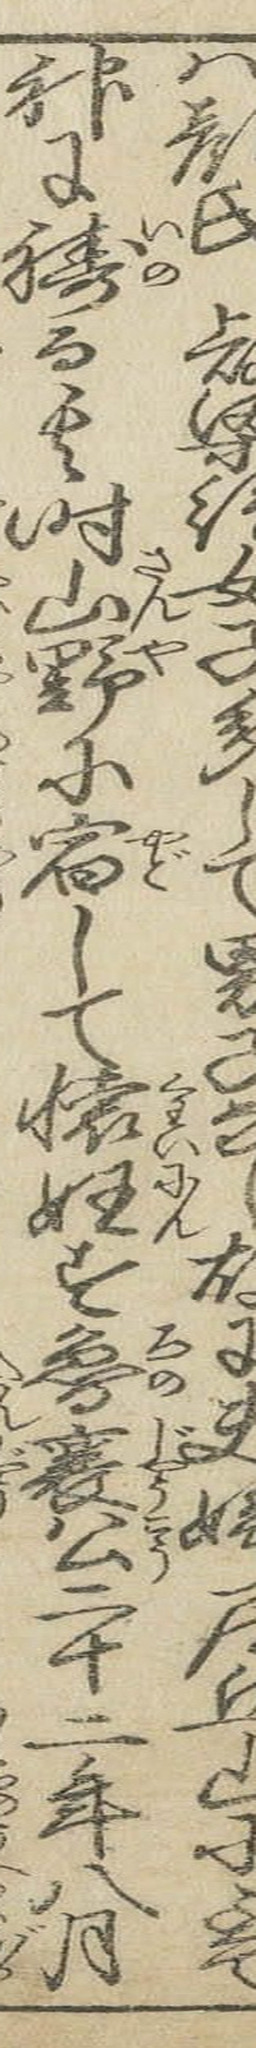神に祷る其時山野に宿して懐妊す魯襄公二十二年八月
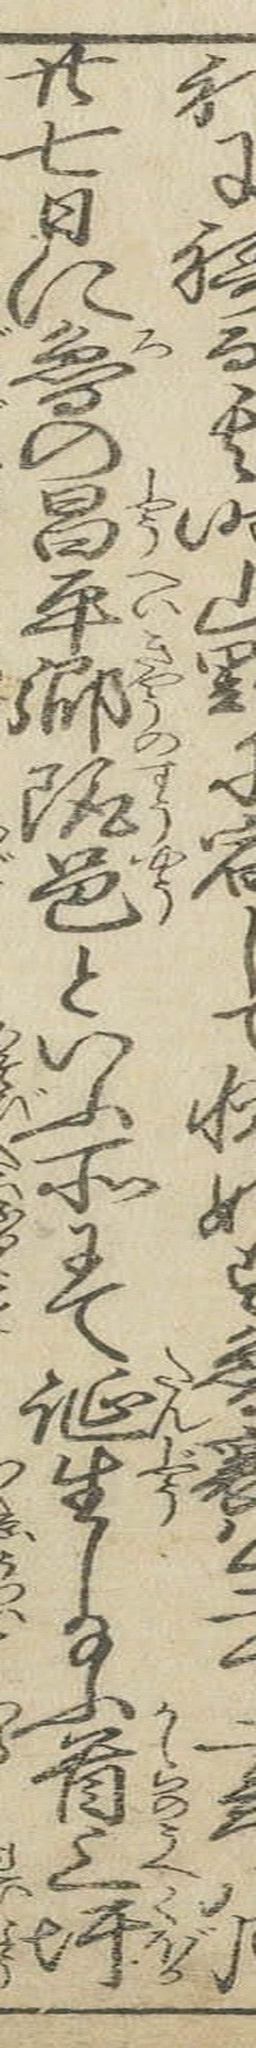廿七日に魯の昌平郷陬邑といふ所にて誕生し給ふ首上圩
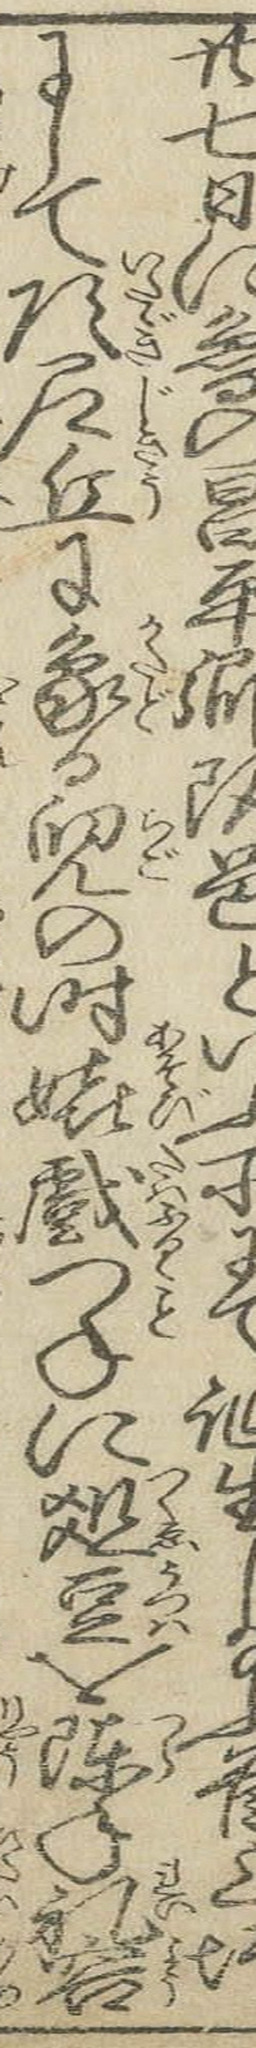にして頂尼丘に象る児の時嬉戯つねに俎豆を陳ね礼容
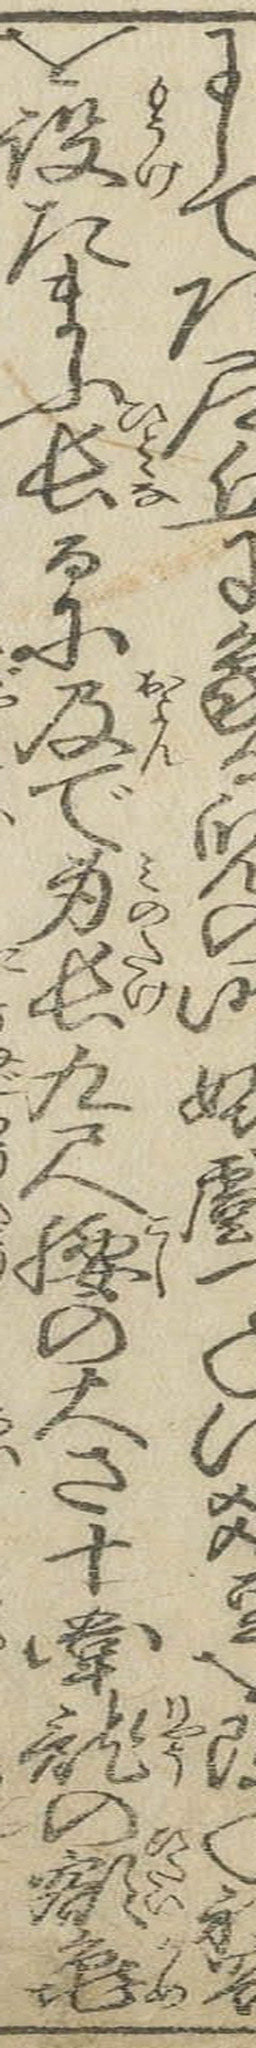を設たまふ長るに及で身長九尺腰の大さ十囲竜の額亀
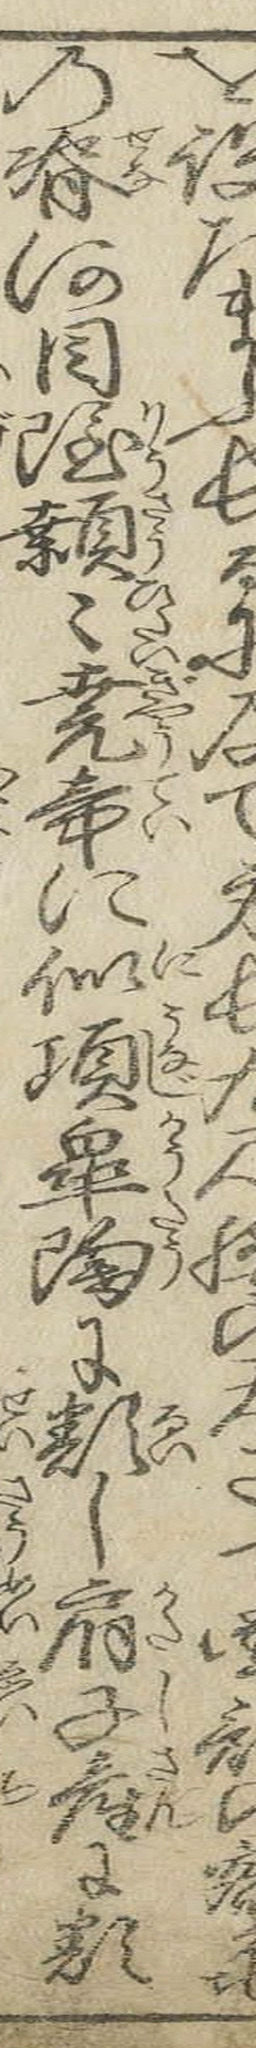の脊河目隆顙々尭帝に似項皐陶に類し肩子産に類
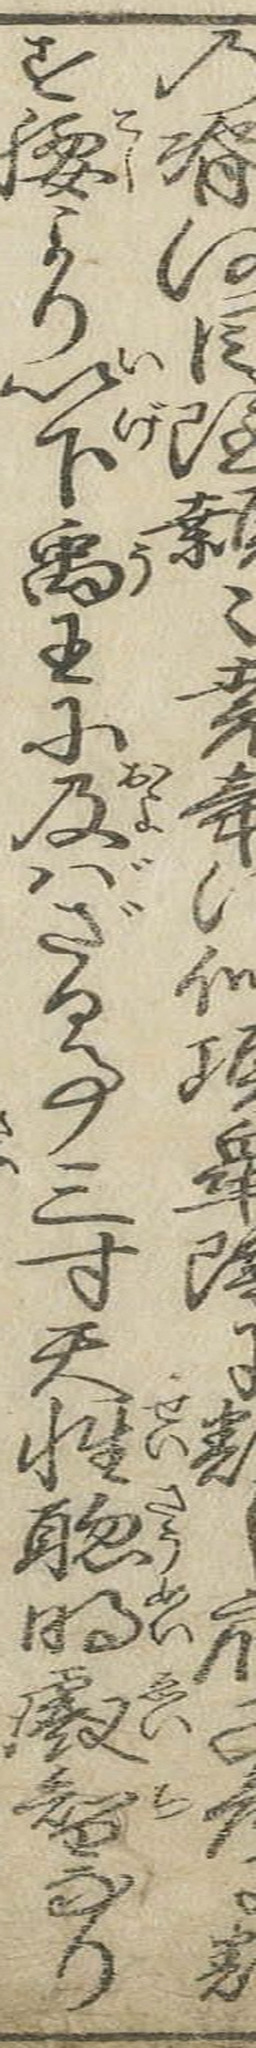す腰より以下禹王に及ばざる事三寸天性聡明叡智なり
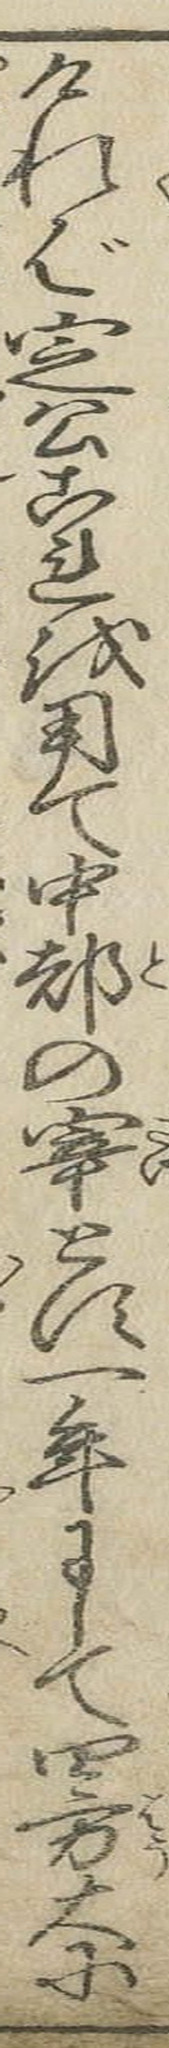ければ定公これを用て中都の宰とす一年にて四方大に
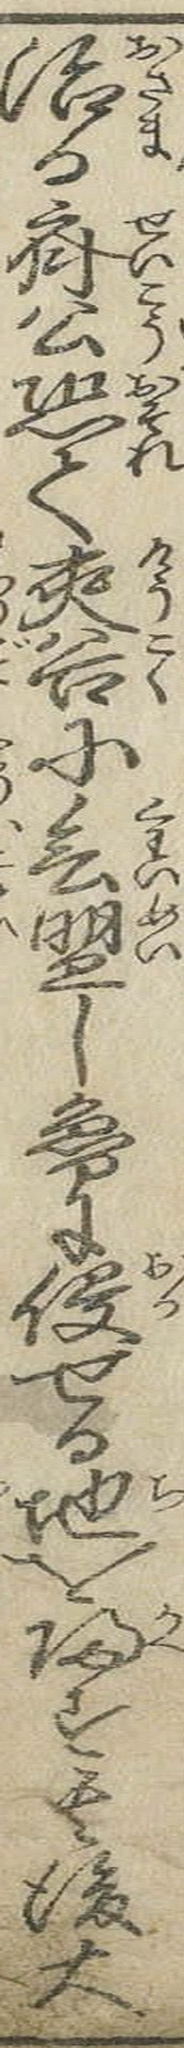治る斉公恐て夾谷に会盟し魯に侵せる地を帰す其後大
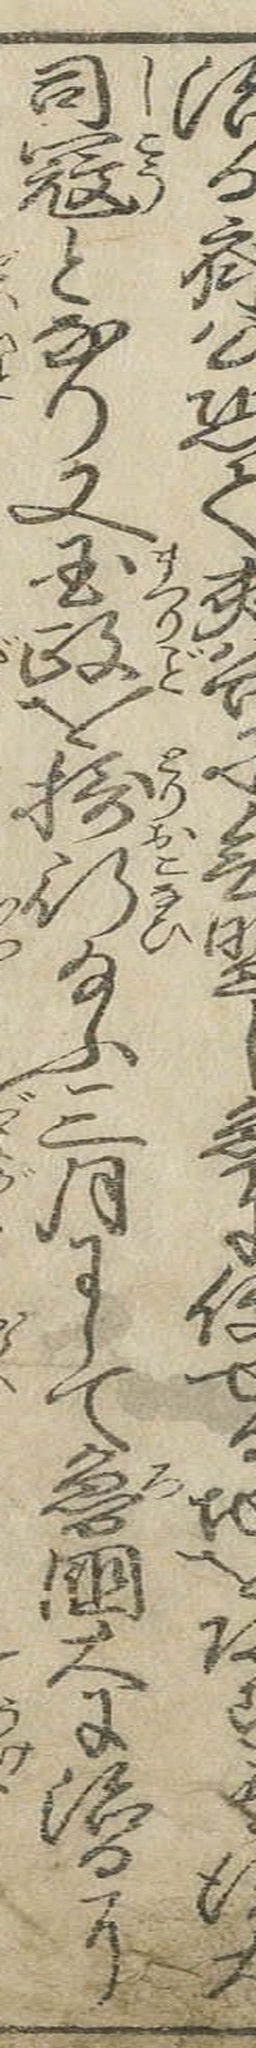司寇となり又国政を摂行給ふ三月にして魯国大に治るに
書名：絵本写宝袋 9巻 5之巻
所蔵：東京学芸大学教育コンテンツアーカイブ
